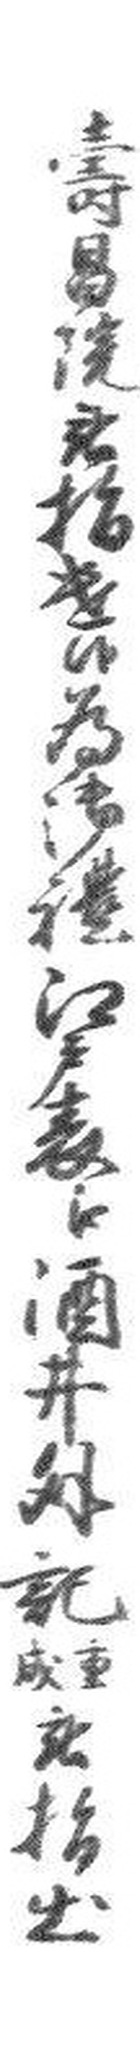寿昌院被指遣候為御礼江戸表江酒井外記重成被指出
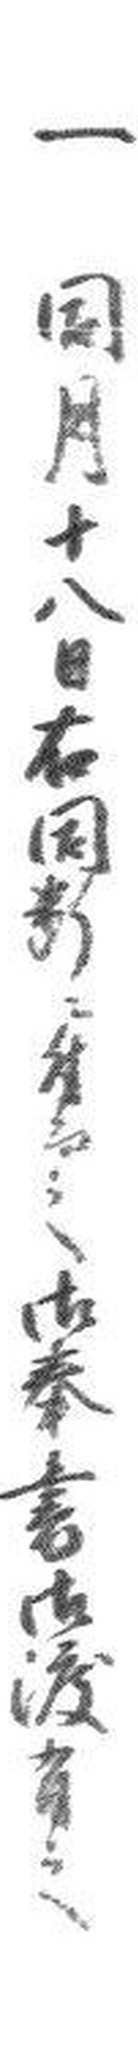一同月十八日右同断ニ付而之御奉書御渡有之
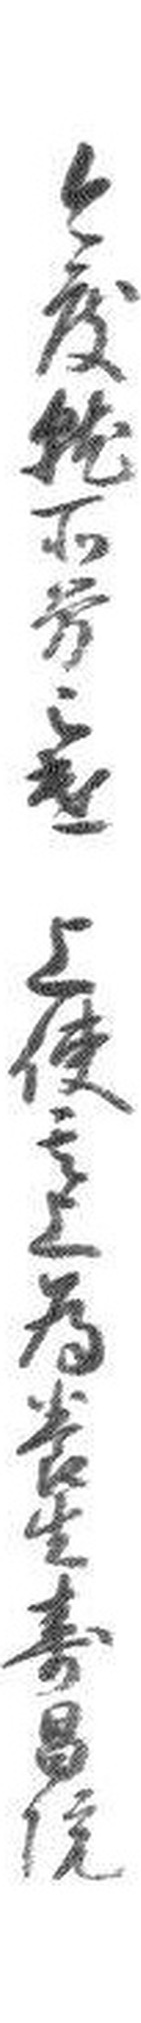今度就所労被遣上使其上為養生寿昌院
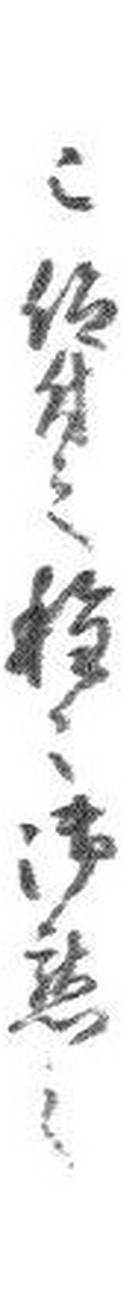被仰付之種々御懇之
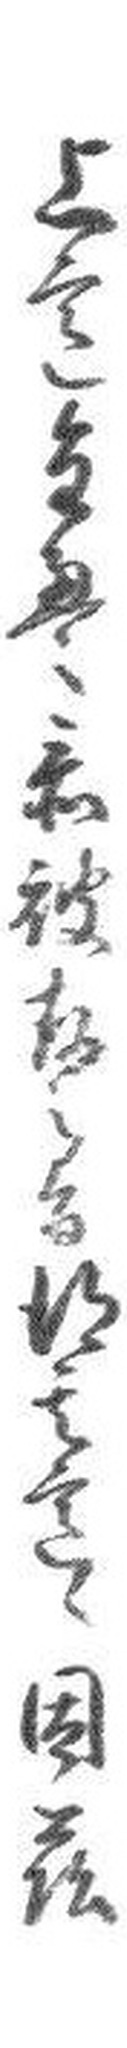上意重畳忝被存候旨得其意候因茲
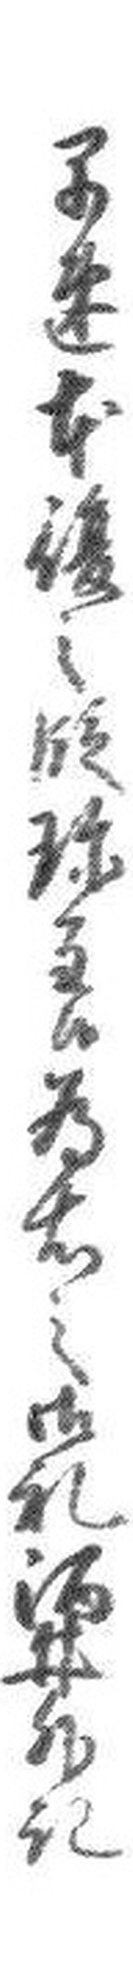早速本復之段珎重候為右之御礼酒井外記
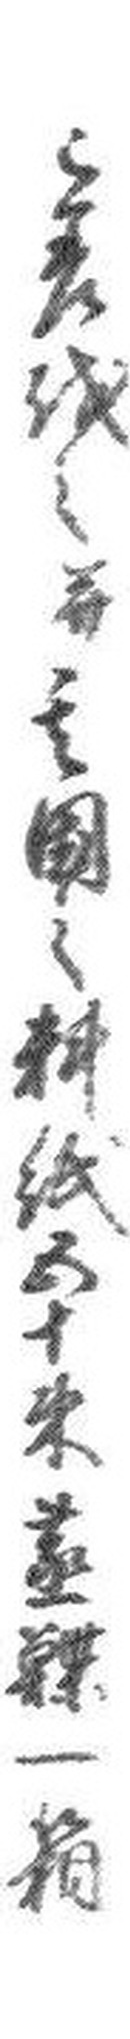被差越之并其国之料紙五十束蒸鰈一箱

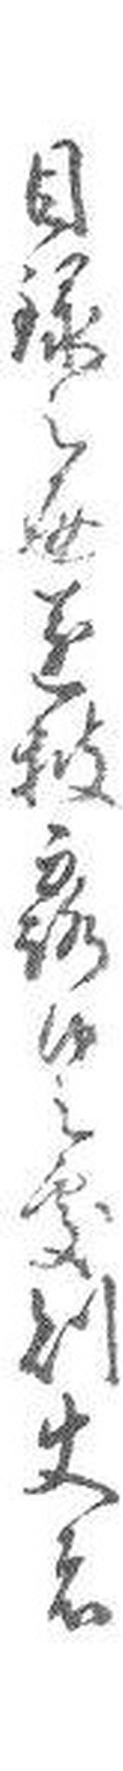目録之通遂披露候之処則使者
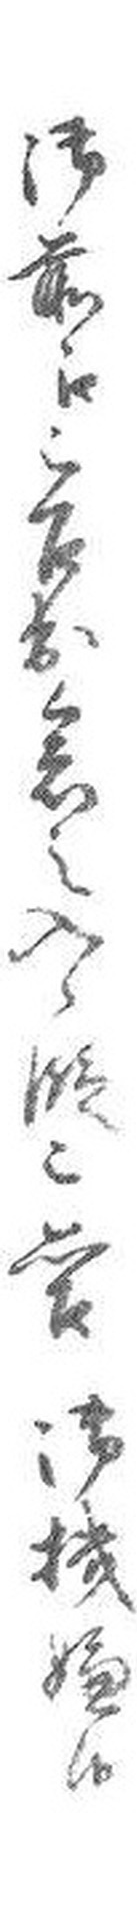御前江被召出念之入候段被思召御機嫌候
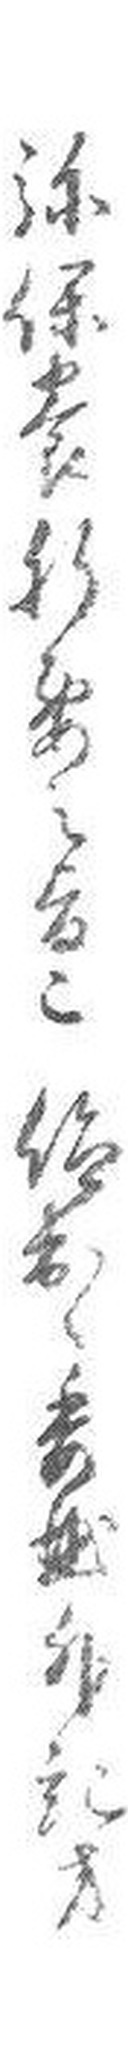弥保養肝要之旨被仰出候委曲外記方
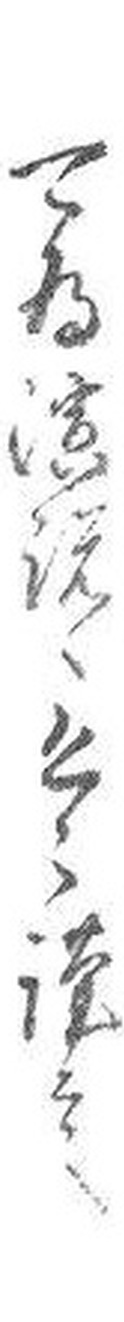可為演説候恐々謹言
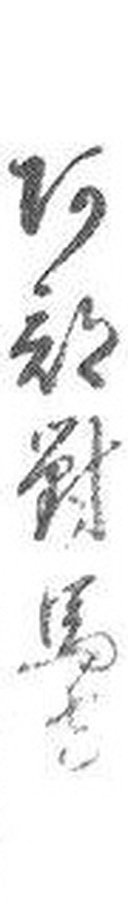阿部対馬守
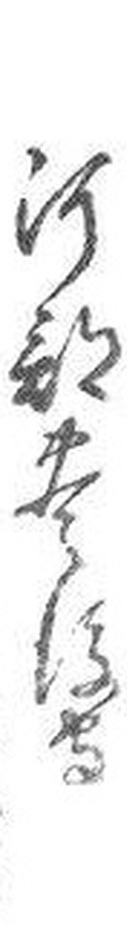阿部豊後守
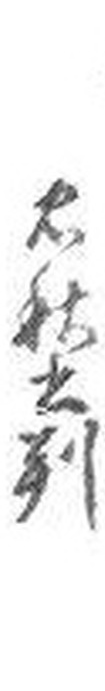忠秋書判
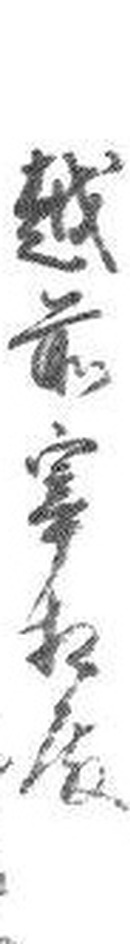越前宰相殿
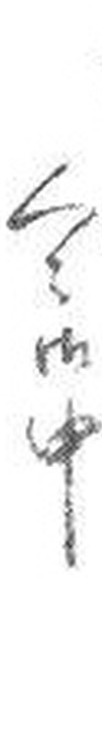人々御中
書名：家譜 四 忠昌公 従寛永七年到正保四年
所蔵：福井県文書館 Fukui Prefectural Archives
